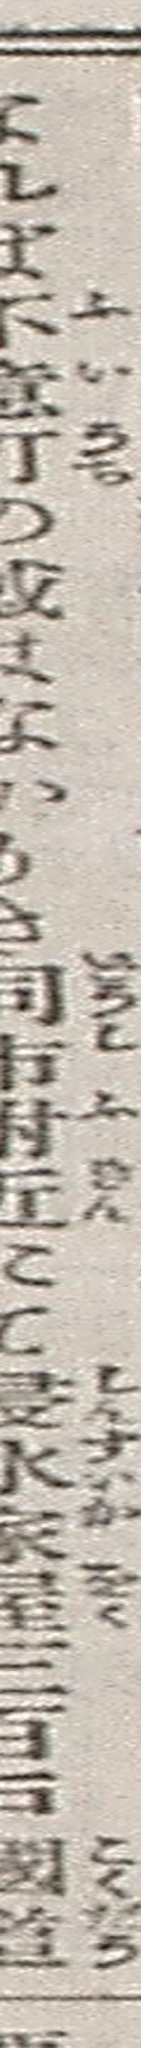なれば不意打の威はなかりき同市附近にて浸水家屋三百戸国道
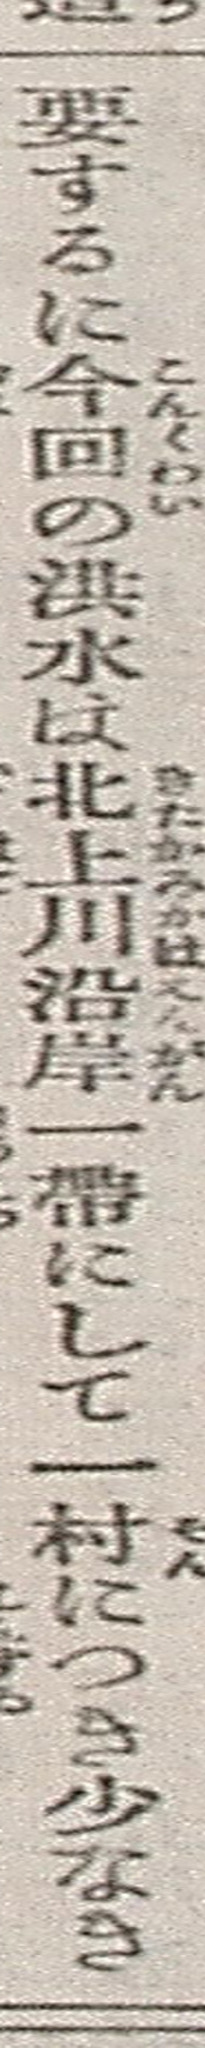要するに今回の洪水は北上川沿岸一帯にして一村につき少なき
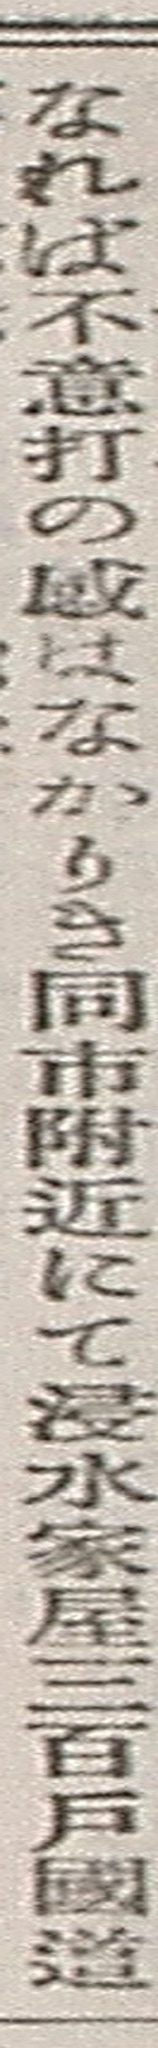なれば不意打の威はなかりき同市附近にて浸水家屋三百戸国道
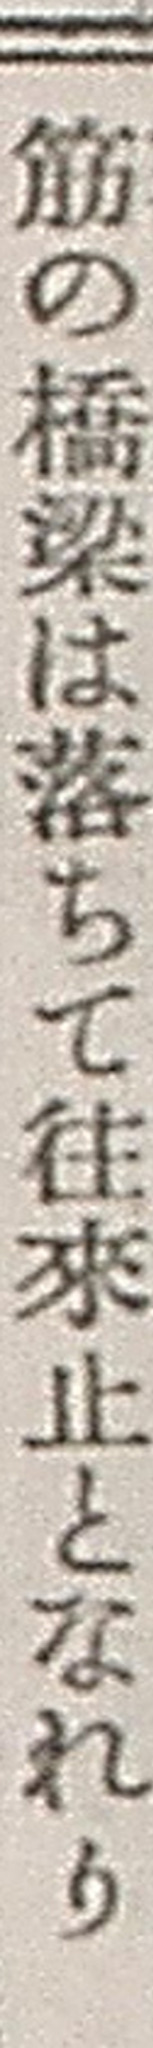筋の橋梁は落ちて往来止となれり
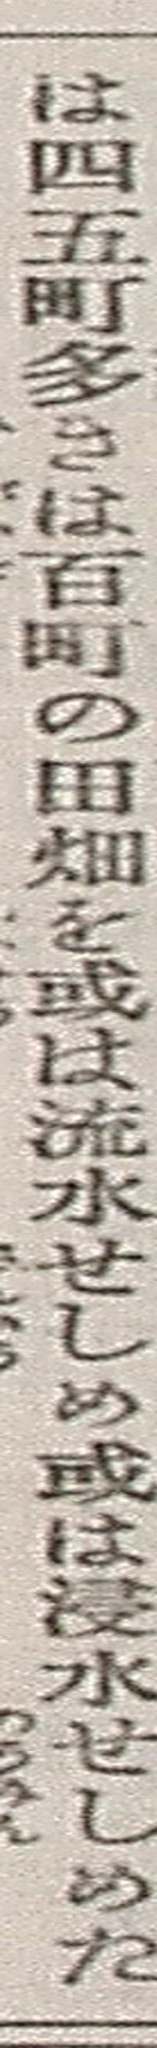は四五町多きは百町の田畑を或は流失せしめ或は浸水せしめた
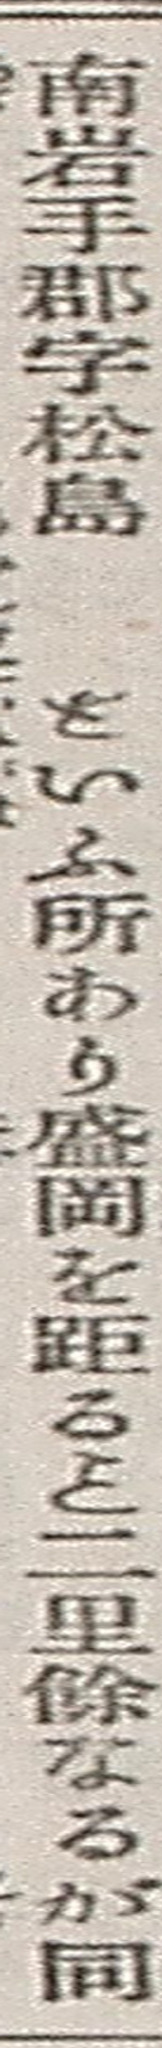南岩手郡字松島といふ所あり盛岡を距ること二里餘なるが同
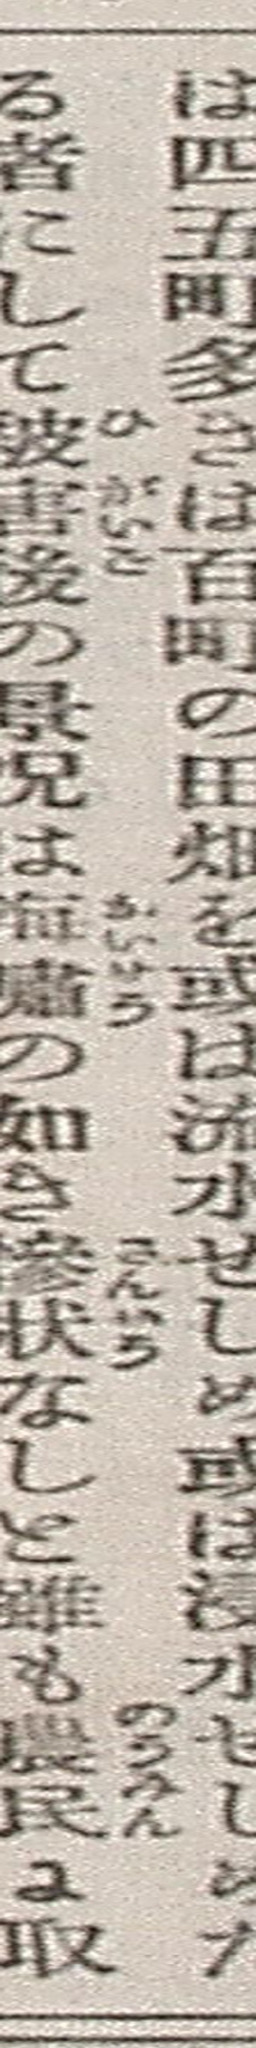る者にして被害後の景況は海嘯の如き惨状なしと雖も農民に取
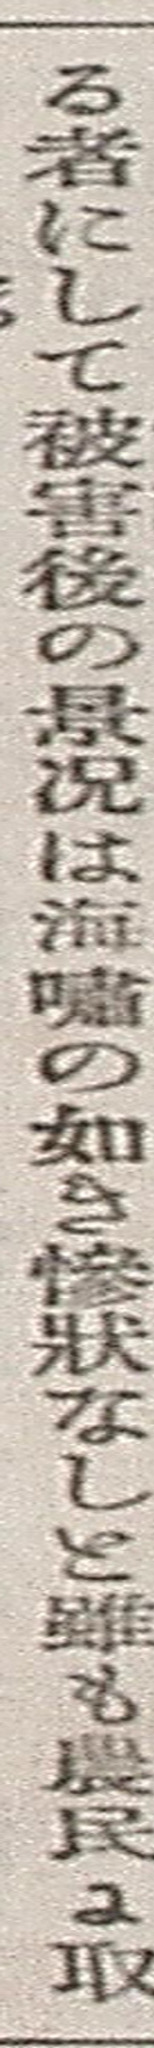る者にして被害後の景況は海嘯の如き惨状なしと雖も農民に取
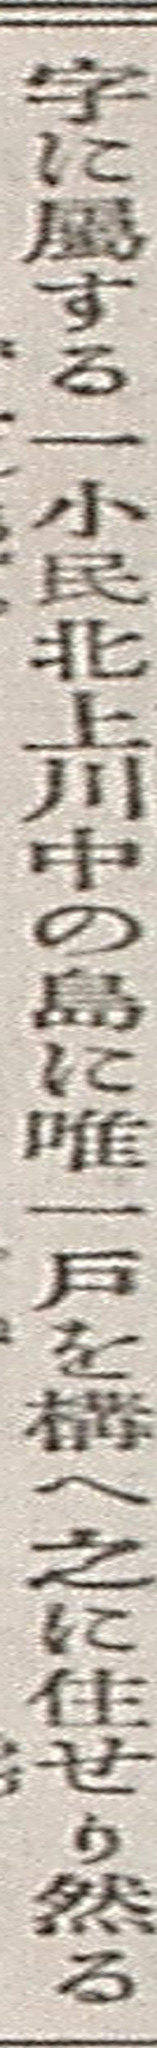字に属する一小民北上川中の島に唯一戸を構へ之に住せり然る
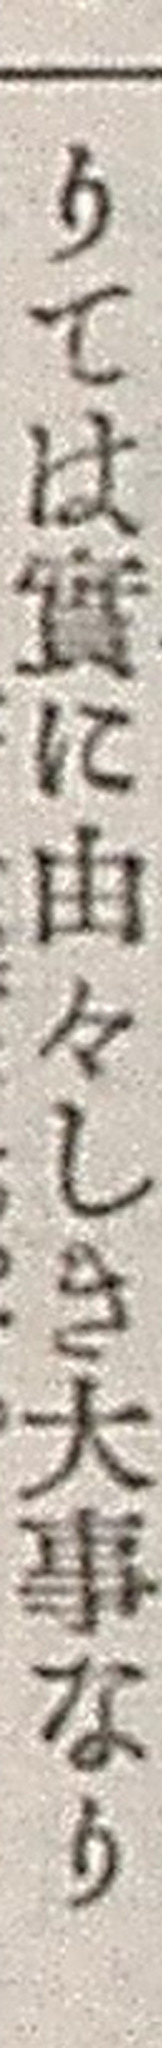りては実に由々しき大事なり
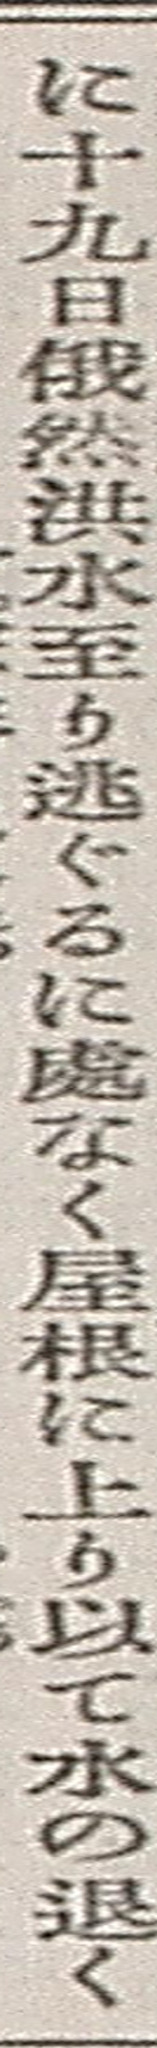に十九日俄然洪水至り逃ぐるに処なく屋根に上り以て水の退く
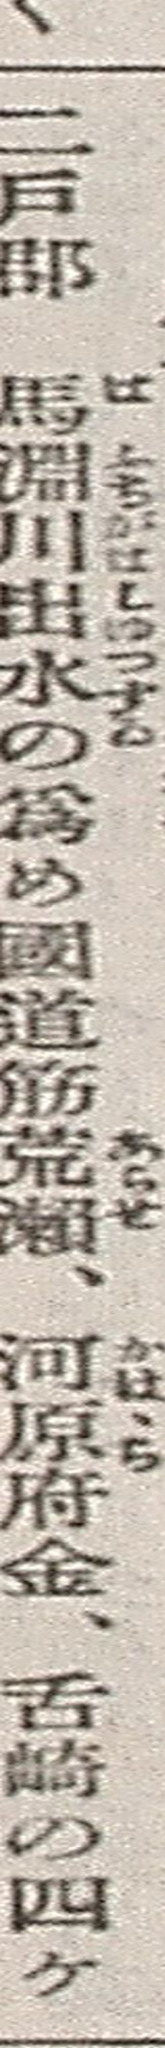二戸郡馬渕川出水の為め国道筋荒瀬、河原府金、舌崎の四ヶ
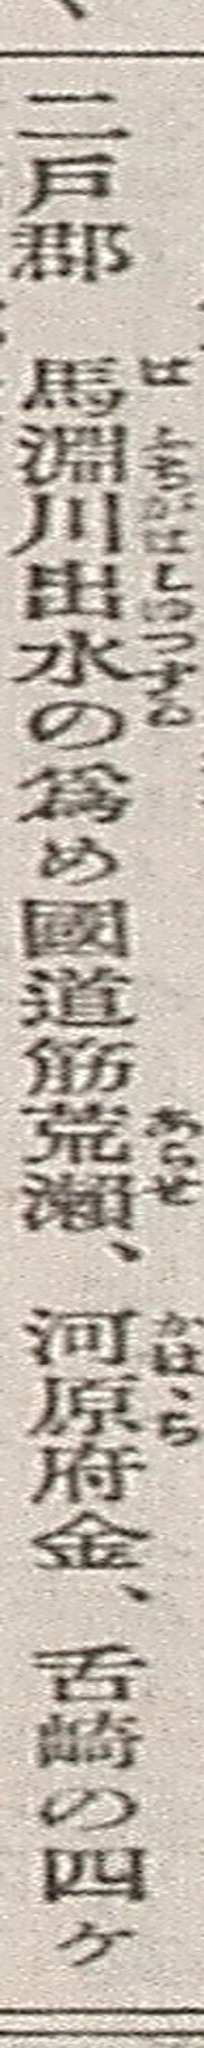二戸郡馬渕川出水の為め国道筋荒瀬、河原府金、舌崎の四ヶ
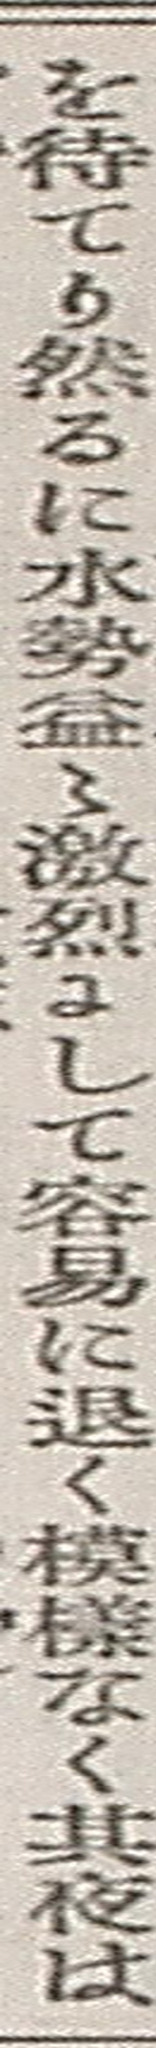を待照り然るに水勢益々激烈にして容易に退く模様なく其夜は
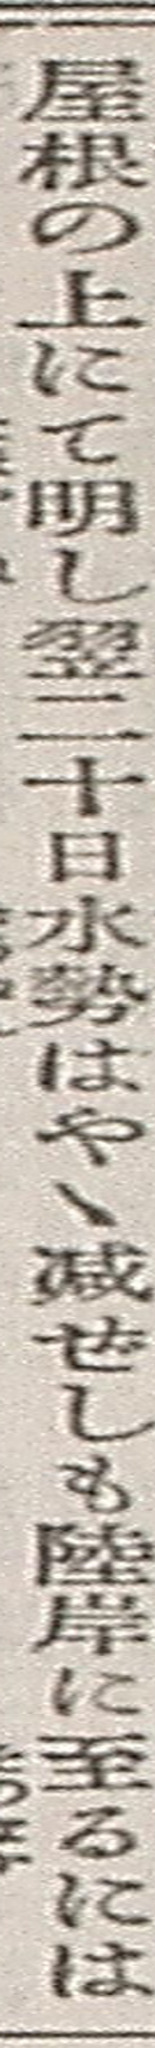屋根の上にて明し翌二十日水勢はやゝ減せしも陸岸に至るには
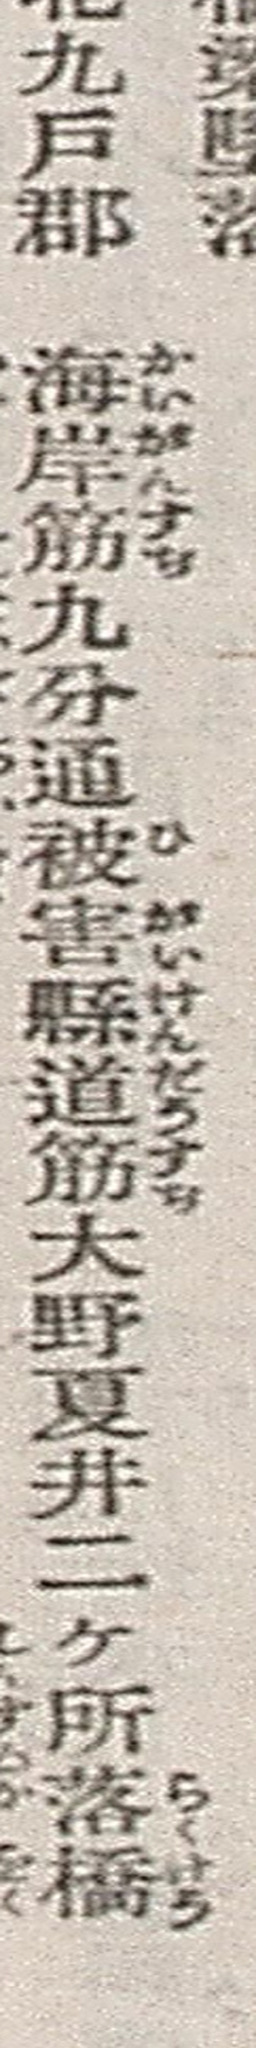南北九戸郡海岸筋九分通被害県道筋大野夏井二ヶ所落橋
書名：風俗畫報臨時増刊第百二十八號　洪水被害録（下）
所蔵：東京大学地震研究所図書室 Earthquake Research Institute Library, The University of Tokyo, JAPAN
